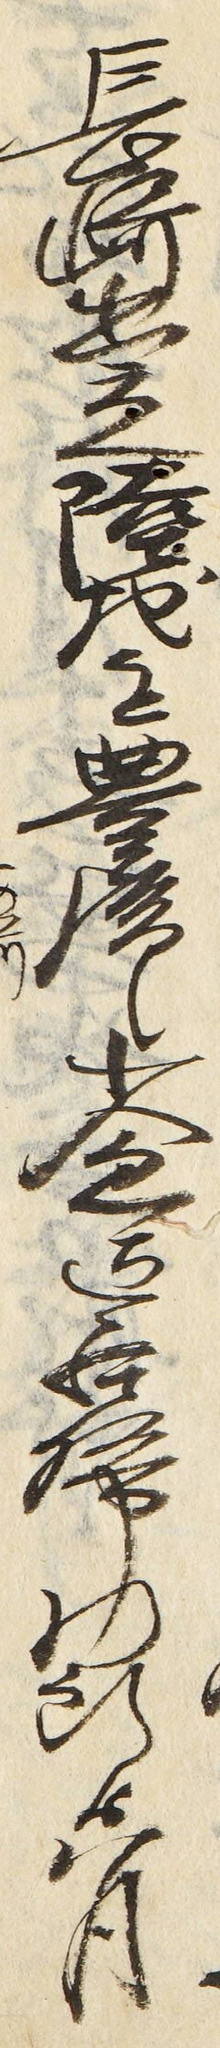長崎出立陸地を豊後之小倉迄御帰同所ゟ八月

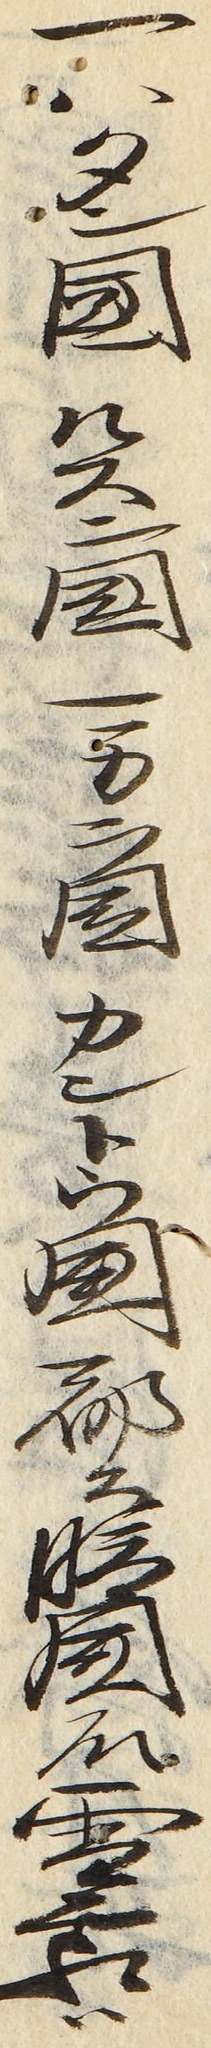一ハタン国ルスニ国マカラ国カントウ国都而暖国故雪義は
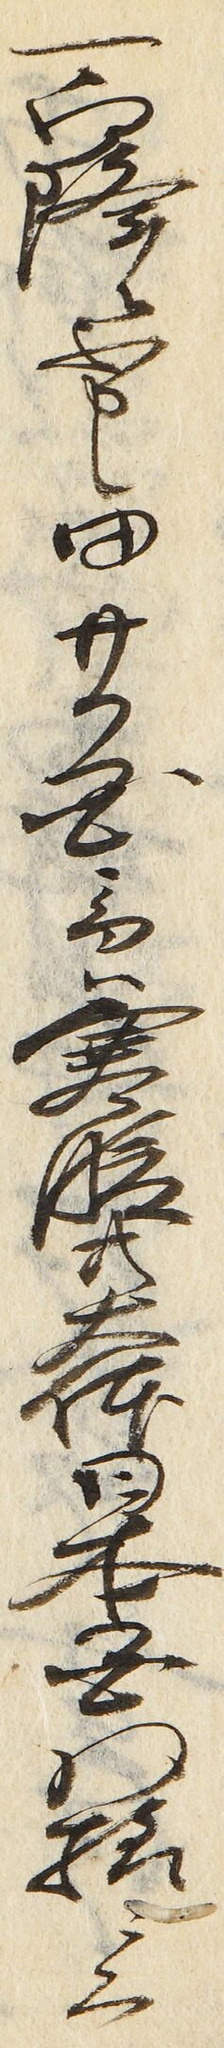一向降り不申候由サフ国ニ而は寒暖共大体日本国同様ニ而
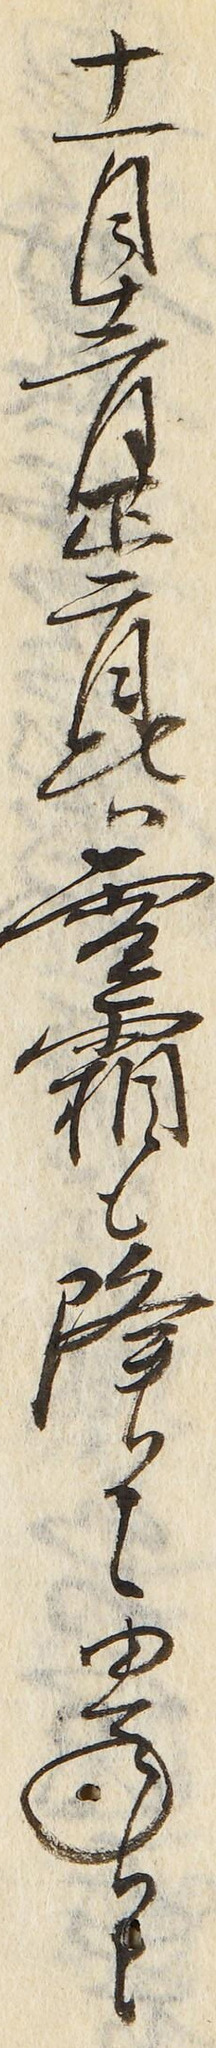十一月十二月正二月頃は雪霜も降り申候由事ニ申候
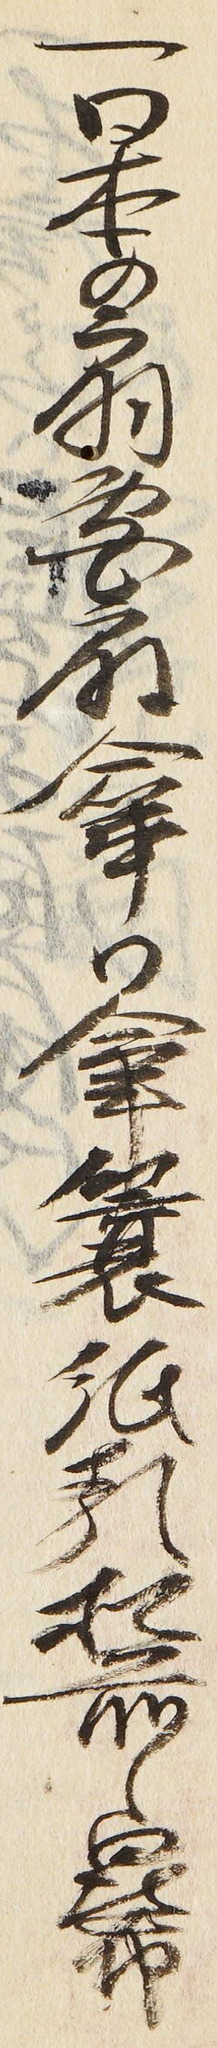一日本の扇団扇傘日傘蓑紙類松前之昆布
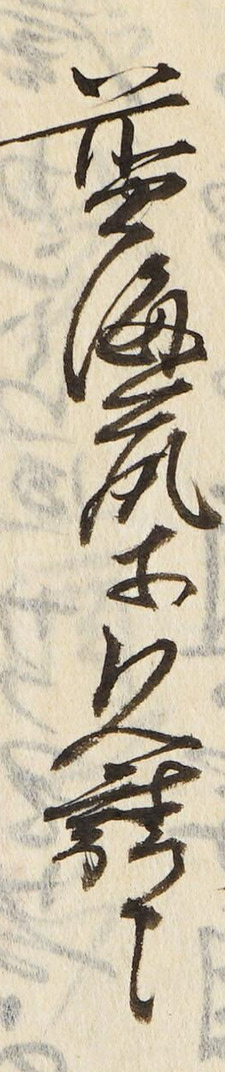煎海鼠等見請申候
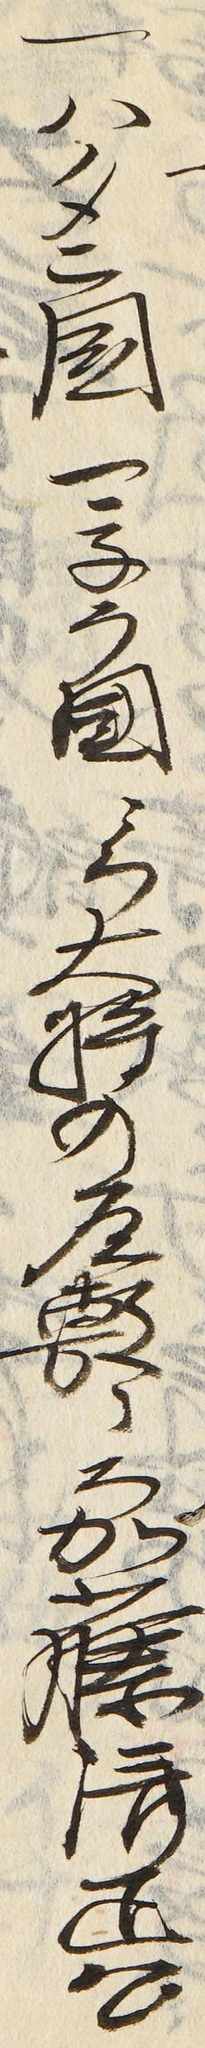一ハタン国マネラ国ニ而大将の屋敷ニ而加藤清正公
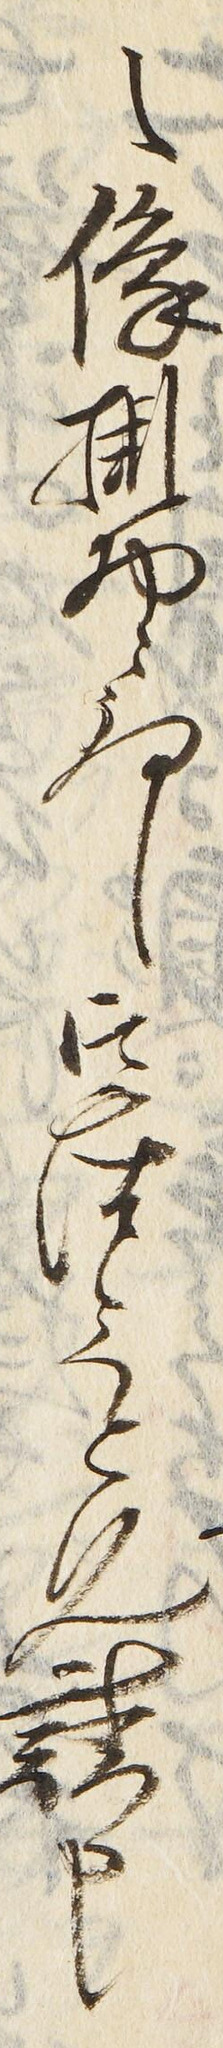之像掛物ニ致し御座候と見請申候
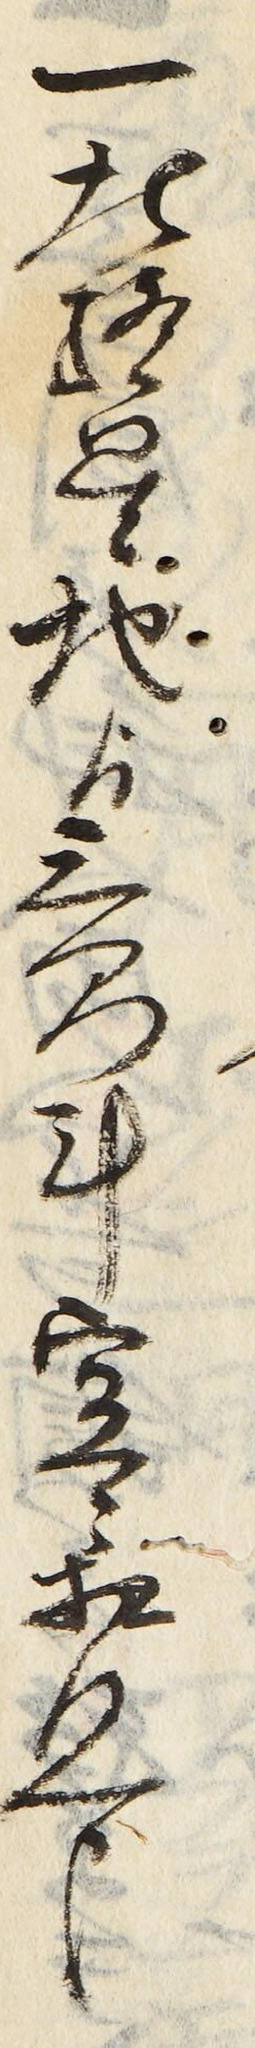一北極星地ゟ三間計宜相見申候

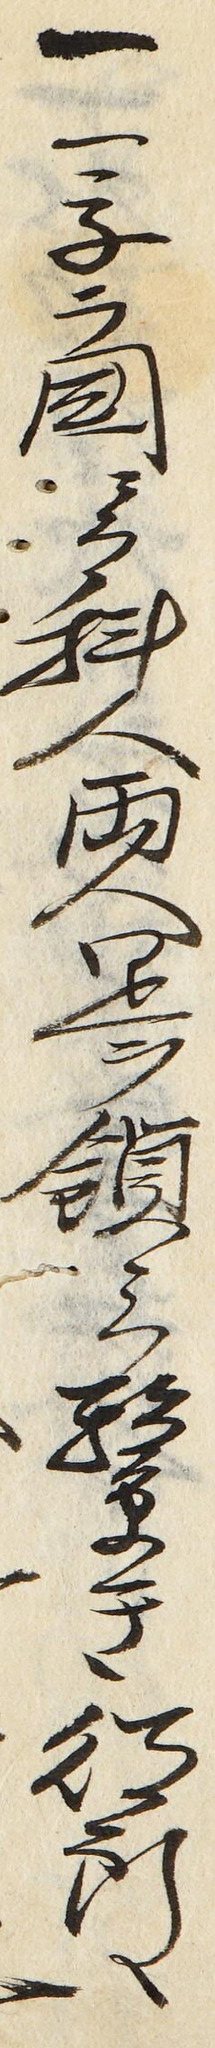一マネラ国ニ而科人両人足ヲ鎖ニ而繫き役所へ
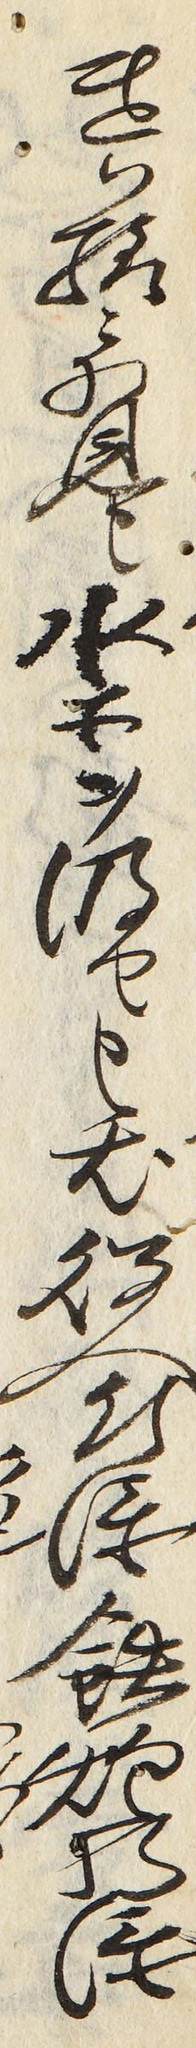連候様ニ相見申候水等ヲ汲セ申候尤役人付添鉄砲付添居申候
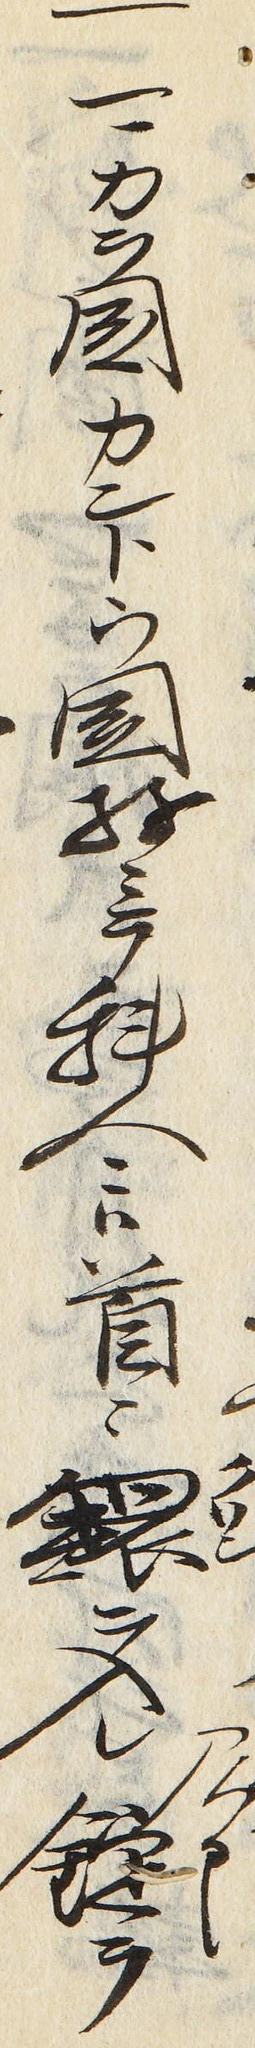一マカラ国カントウ国抔ニテ科人ニは首に鐶ヲ入レ錠ヲ
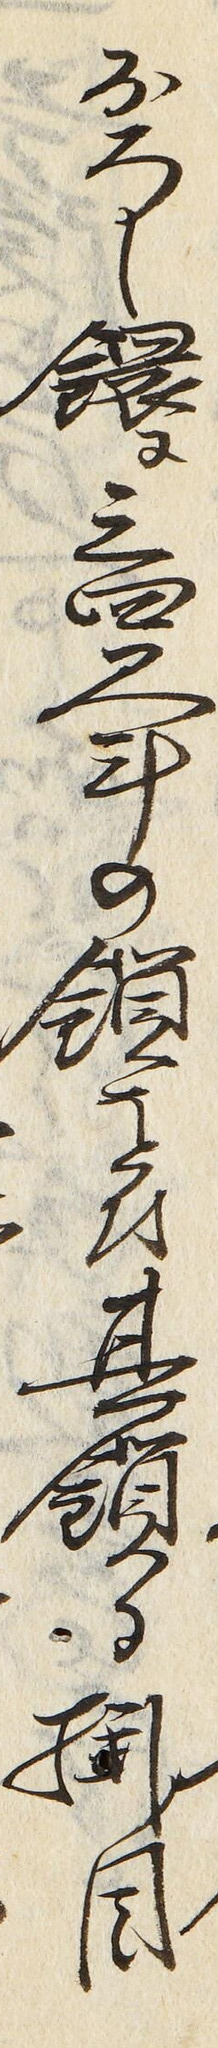おろし鐶に三四尺計の鎖を付其鎖に掛
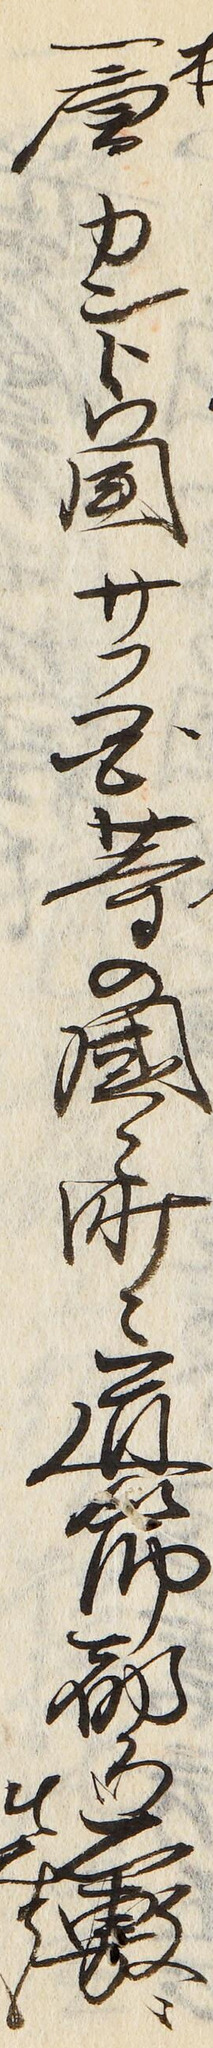一唐カントウ国サラ国等の国々町々道筋都而石敷に御座候
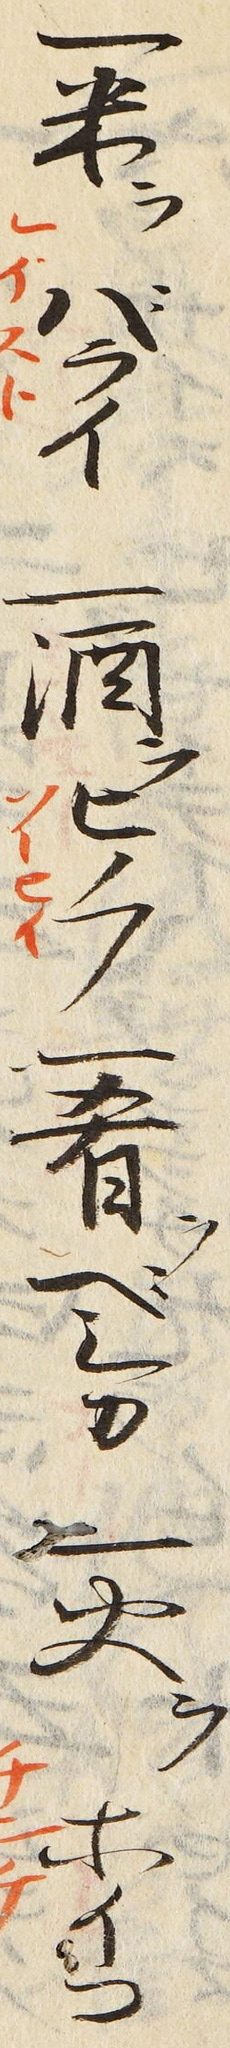一米ヲバライ一酒ヲヒノフ一肴ヲベシカ一火ヲホイコ
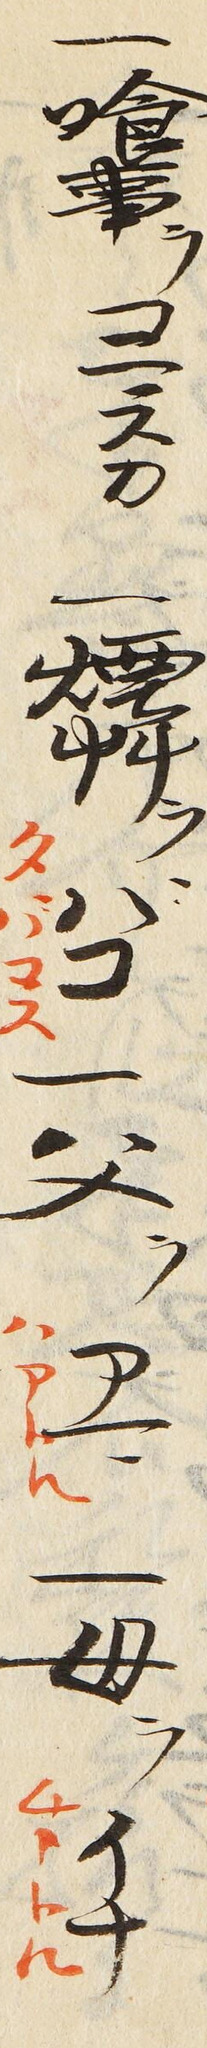一喰事ヲコマスカ一煙草ヲバコ一父ヲアマ一母ヲイチ
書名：漂流記
